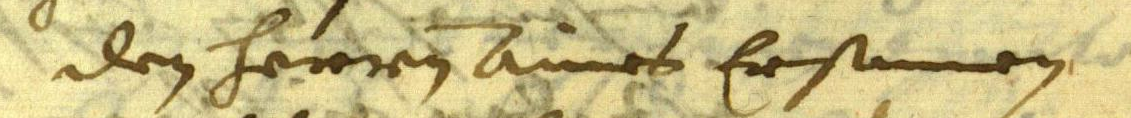den herrn Aines Ersamen
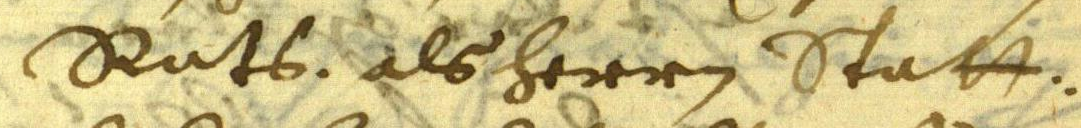Rats. als herrn Statt¬
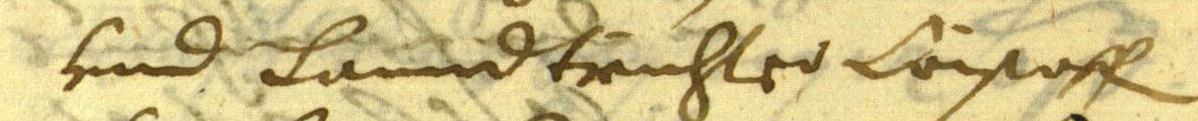vnd Lanndtrichter Cristoff
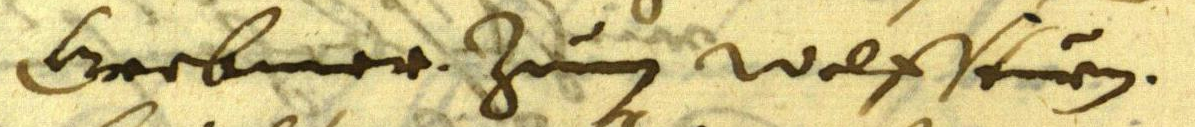Grebmer. Zūm Wolfstūrn.
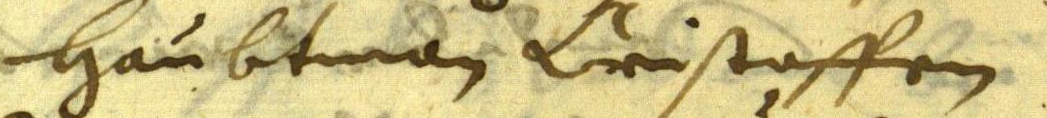Haūbtman Cristoffen
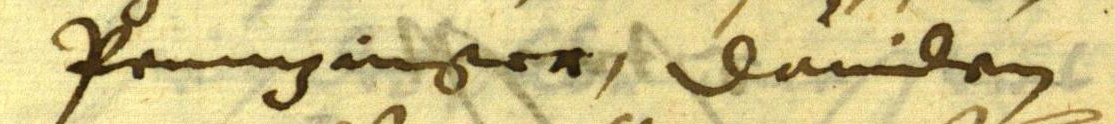Pennzinger, Daūiden
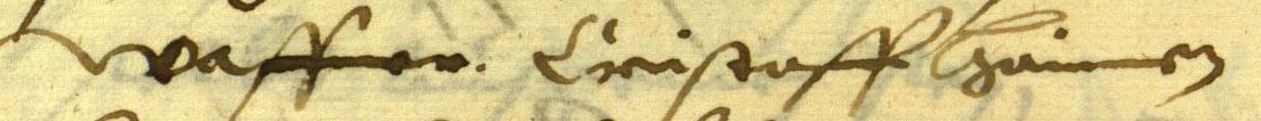Waffner. Cristoff Haimen,
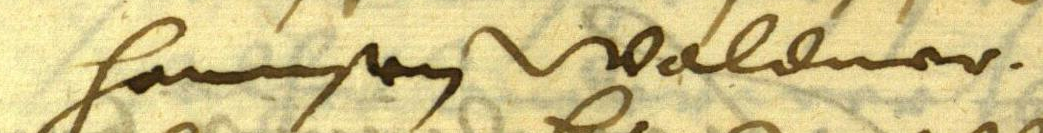hannsen Waldner.
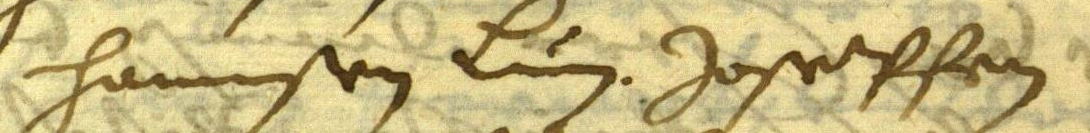hannsen Lūn. Joseffen
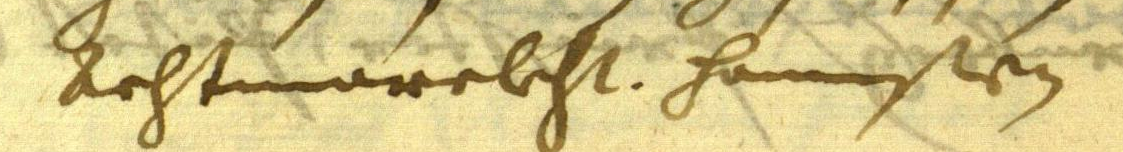Achtmarckht. hannsen
